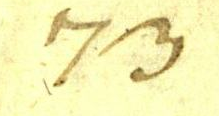73
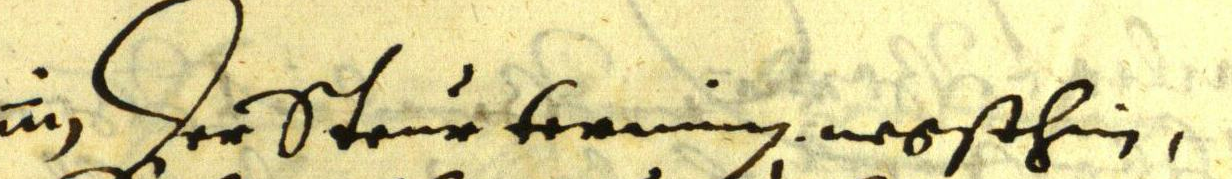Der Steūrtermin. negsthin,
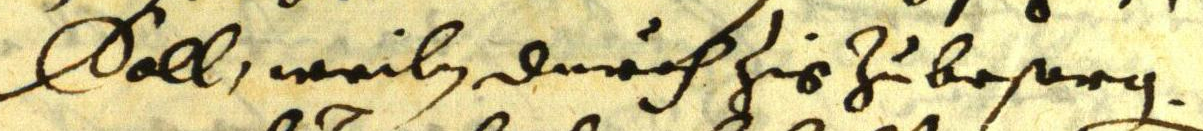Soll, weiln dūrch Zig Zū besorg.
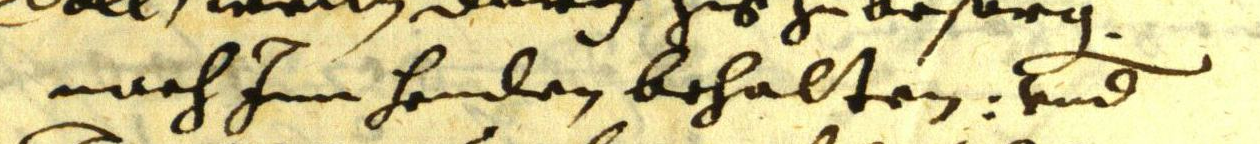noch Inn henden behalten: vnd
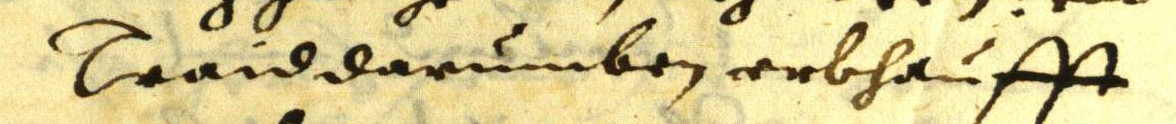Traid darūmben erkhaūfft
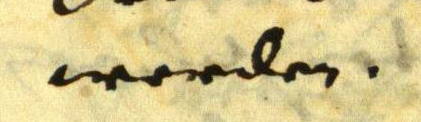werden.
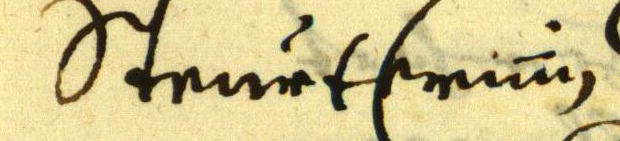Steūrtermin.
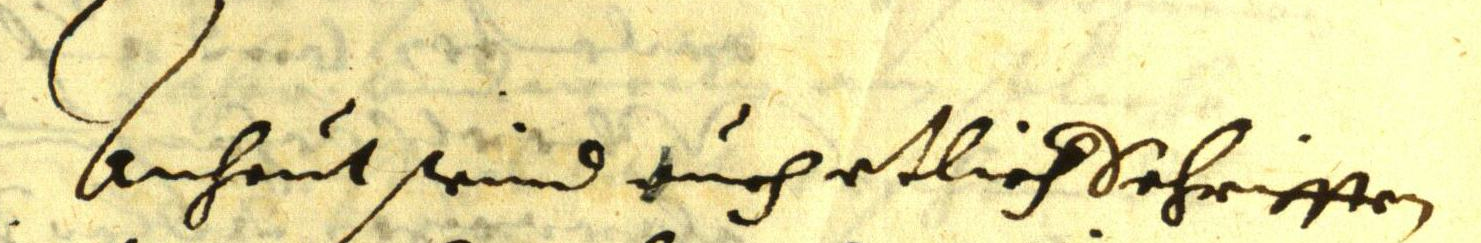Anheūt seind aūch etlich Schrifften
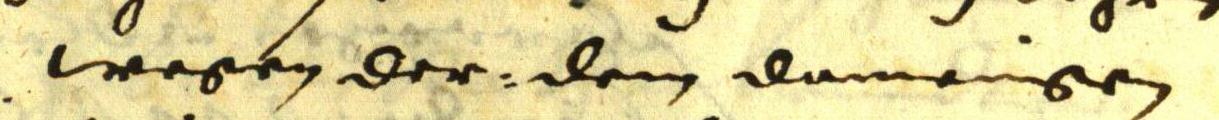wegen der: dem Domenigen
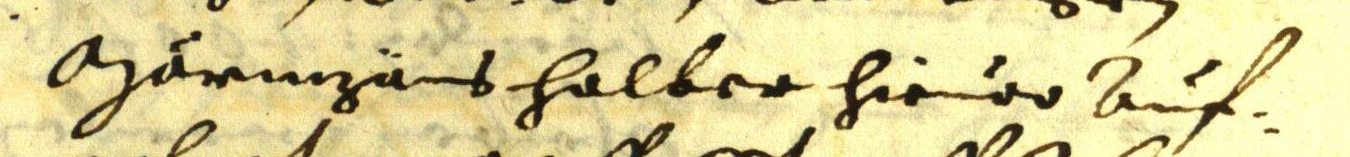Mārntzäns halber hieūor Aūf¬
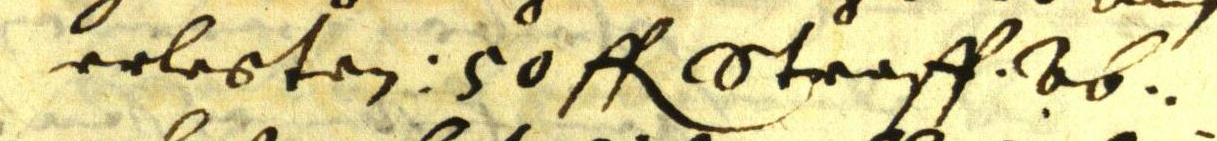erlegten: 50 fl Straff. Ab¬
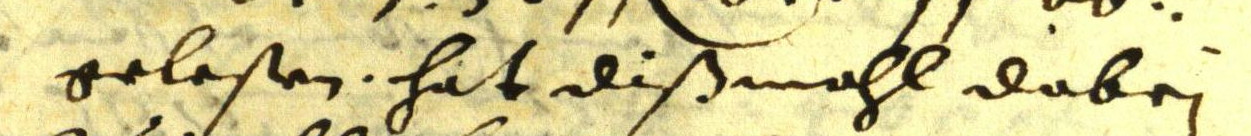gelesen. hat dißmahl dabej
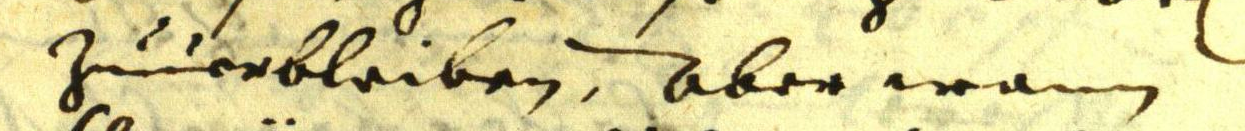Zūūerbleiben, Aber wann
